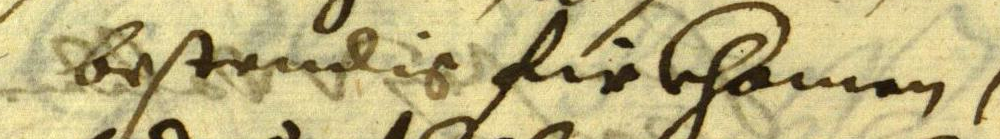bestendig fir khomen,
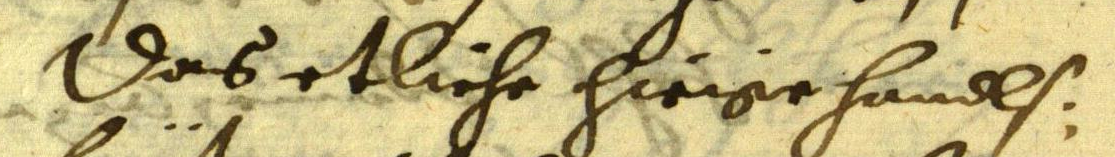Das etliche hieige handls¬
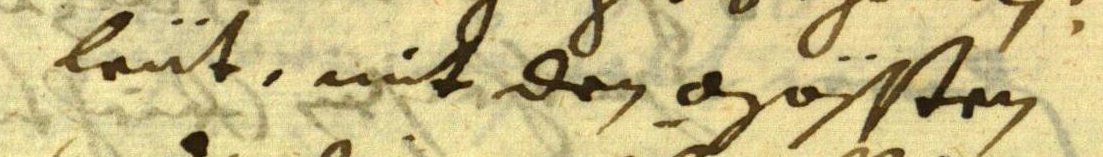leüt, mit den Mössten
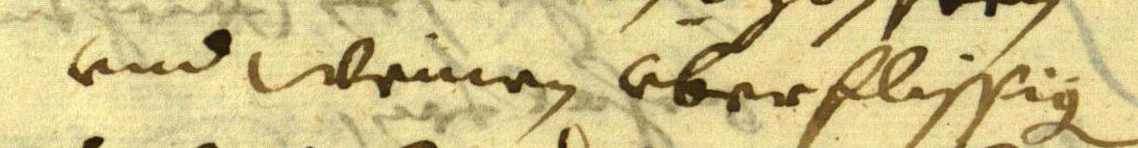vnd Weinen v̈berflissig
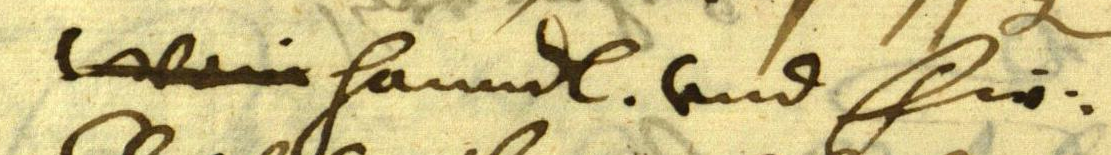Wein hanndl. vnd fir¬
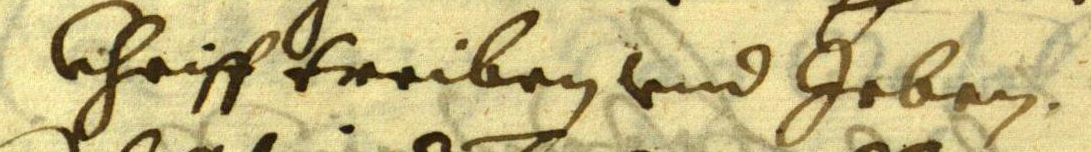kheiff treiben vnd Jeben.
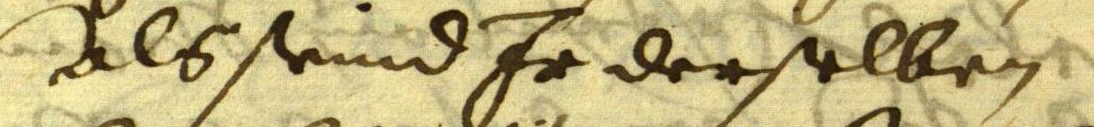Als seind Ir derselben
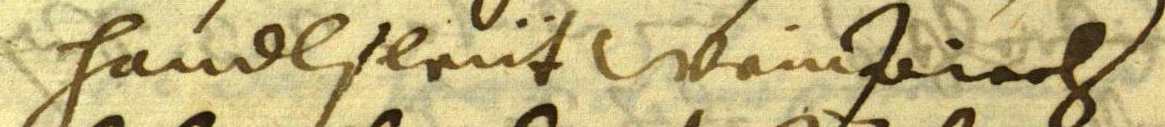handlsleüt Wein Piech
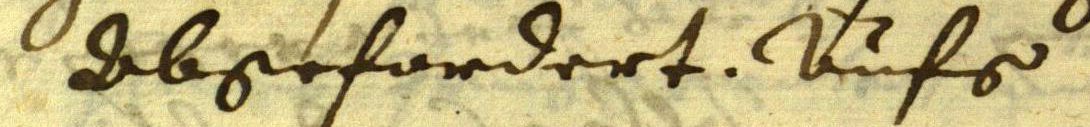Abgefordert. Aūfs
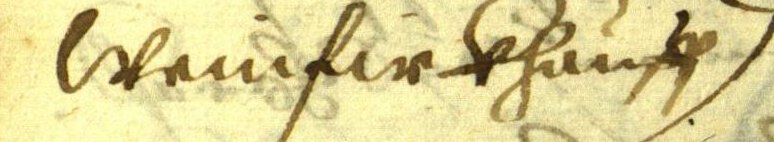Wein fir khaūff
